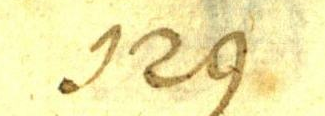129
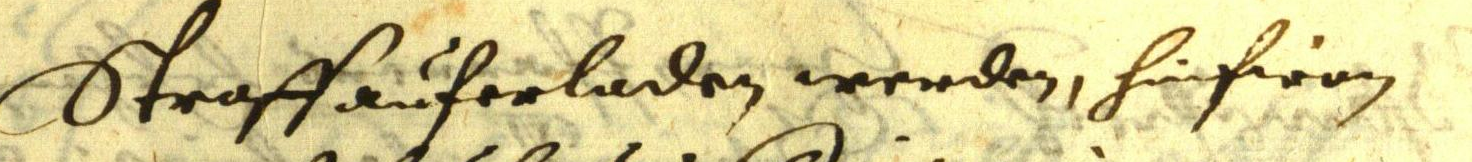Straff aūferladen werden, hinfiran
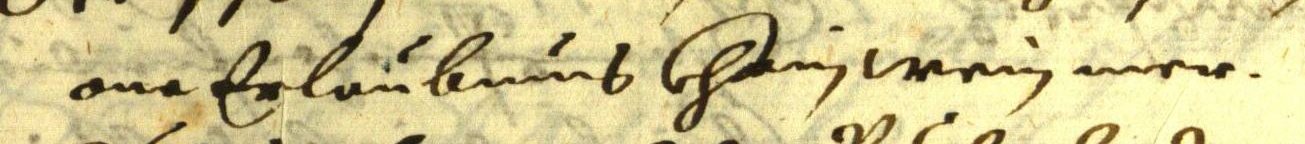one Erlaūbnūs khain wein mer
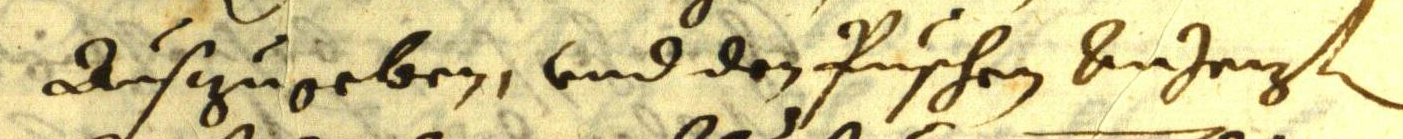Aūszūgeben, vnd den Pūschen An Jezt
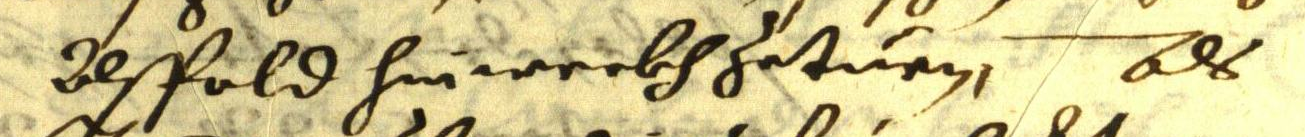AlsPald hin weckh Zetūen, Als
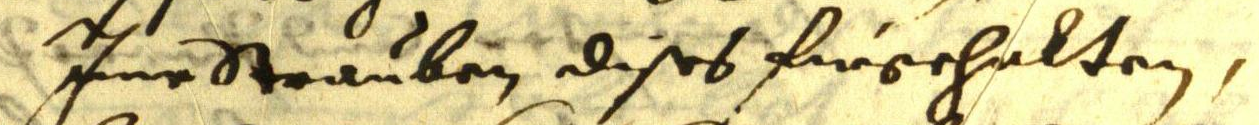Ime Straūben dises firgehalten,
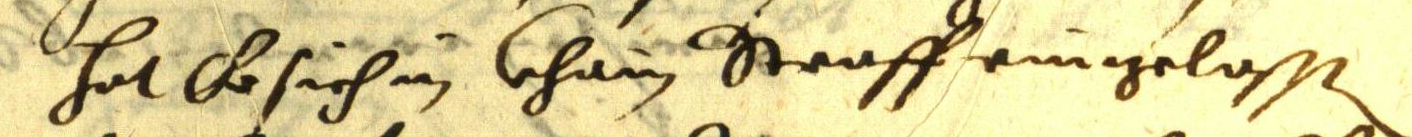hat Er sich in khain Straff einzelass
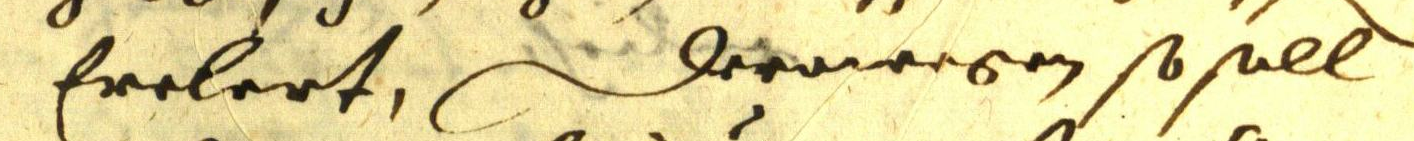Erclert, Derowegen so soll
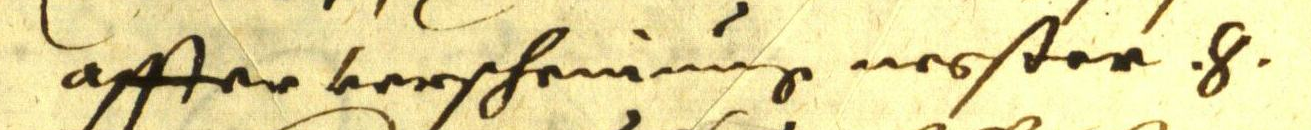affter verscheinūng negster .8.
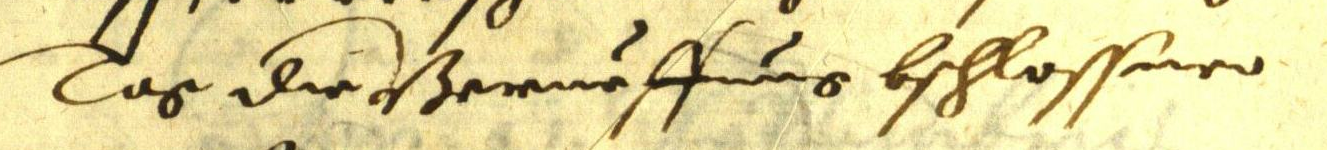Tag der Berūeffūng bschlossner
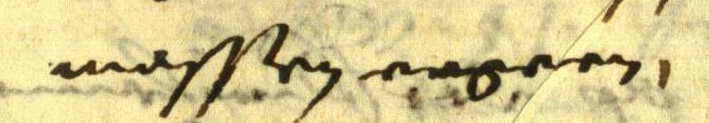massen ergeen,
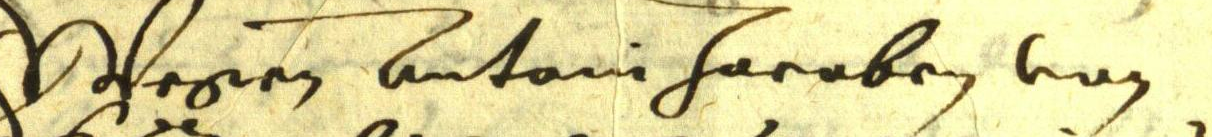Wegen Antoni Jacoben von
